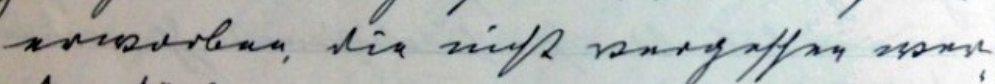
erworben, die nicht vergessen wer
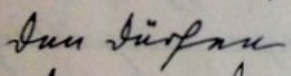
den dürfen.
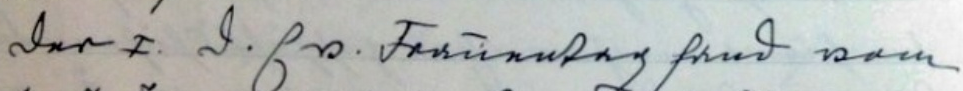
Der I. D. Ev. Frauentag fand vom
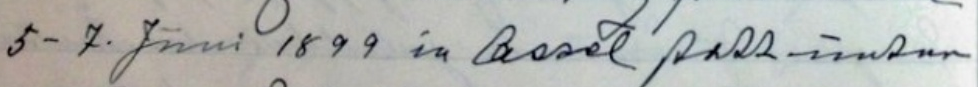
5.-7. Juni 1899 in Cassel statt unter
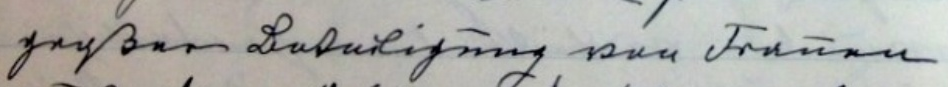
unter großer Beteiligung von Frauen
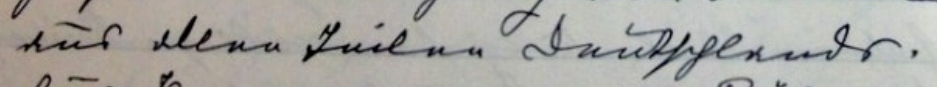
aus allen Teilen Deutschlands.
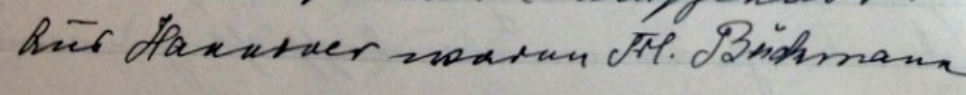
Aus Hannover waren Frl. Buckmann
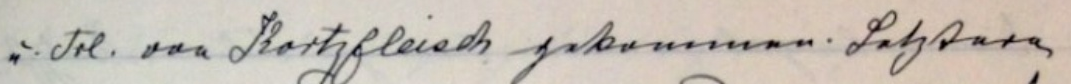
u. Frl. von Kortzfleisch gekommen. Letztere
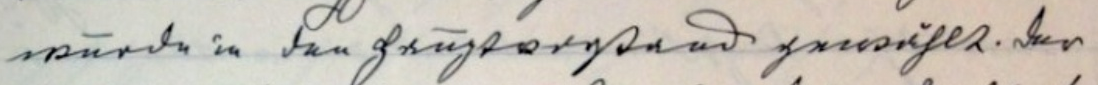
wurde in den Hauptvorstand gewählt. Der
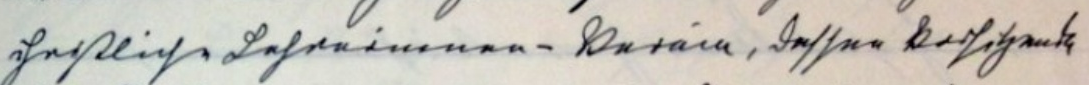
christliche Lehreinnen-Verein, dessen Vorsitzende
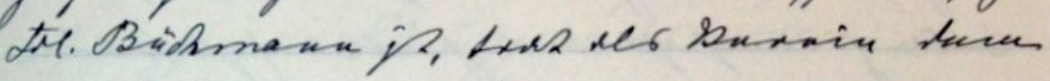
Frl. Buckmann ist, trat als Verein dem
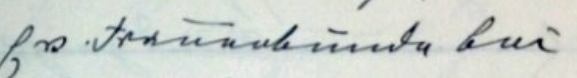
Ev. Frauenbunde bei.
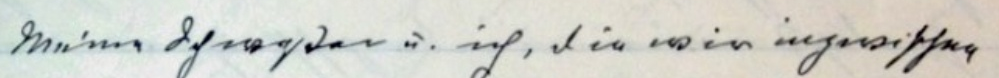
eine Schwester u. ich, die wir inzwischen
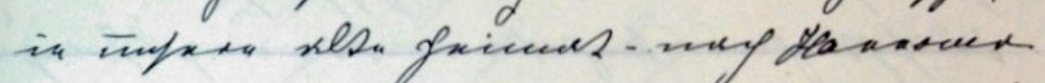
in unsere alte Heimat, nach Hannover
